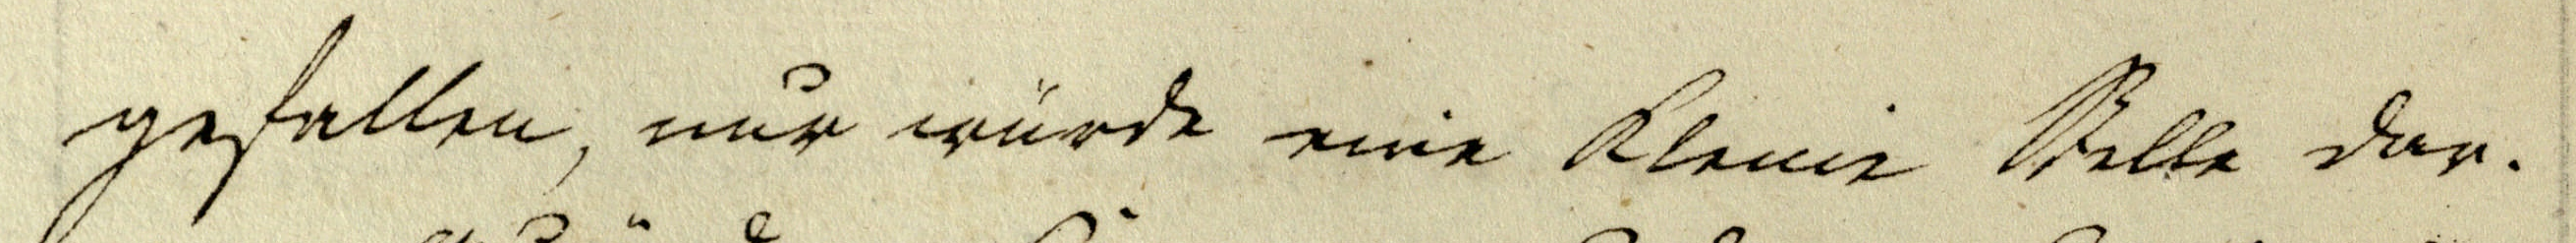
gefallen, nur würde eine kleine Stelle dar¬
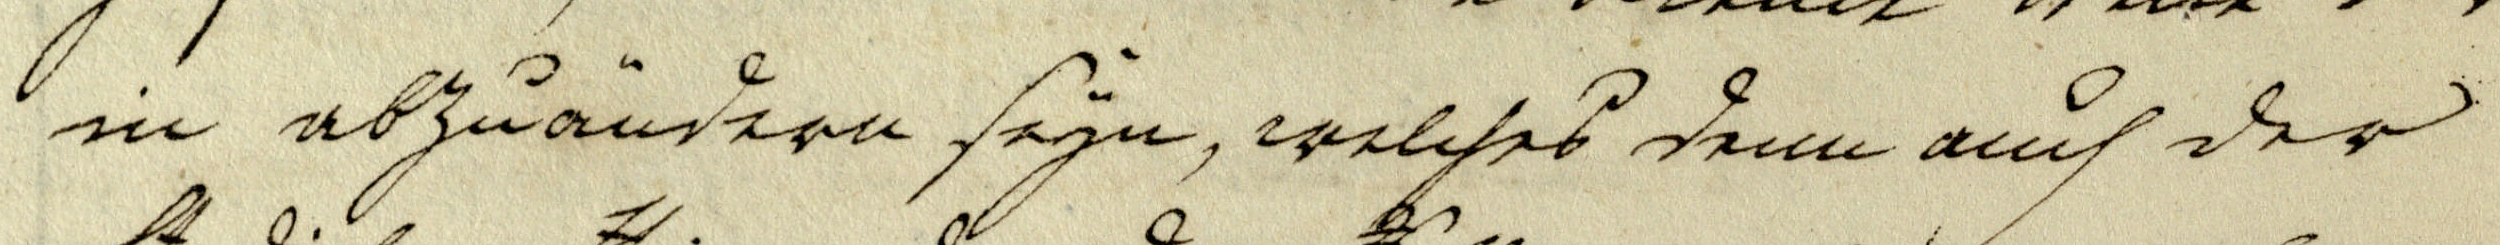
in ab zuändern seÿn, welches denn auch der
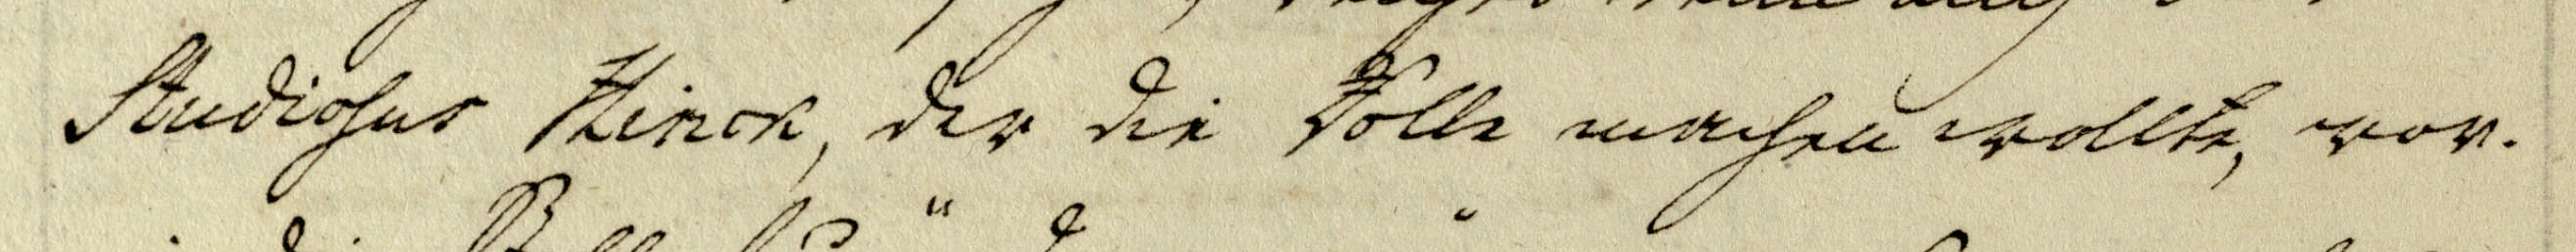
Studiosus Hinck, der die Rolle machen wollte, wor¬
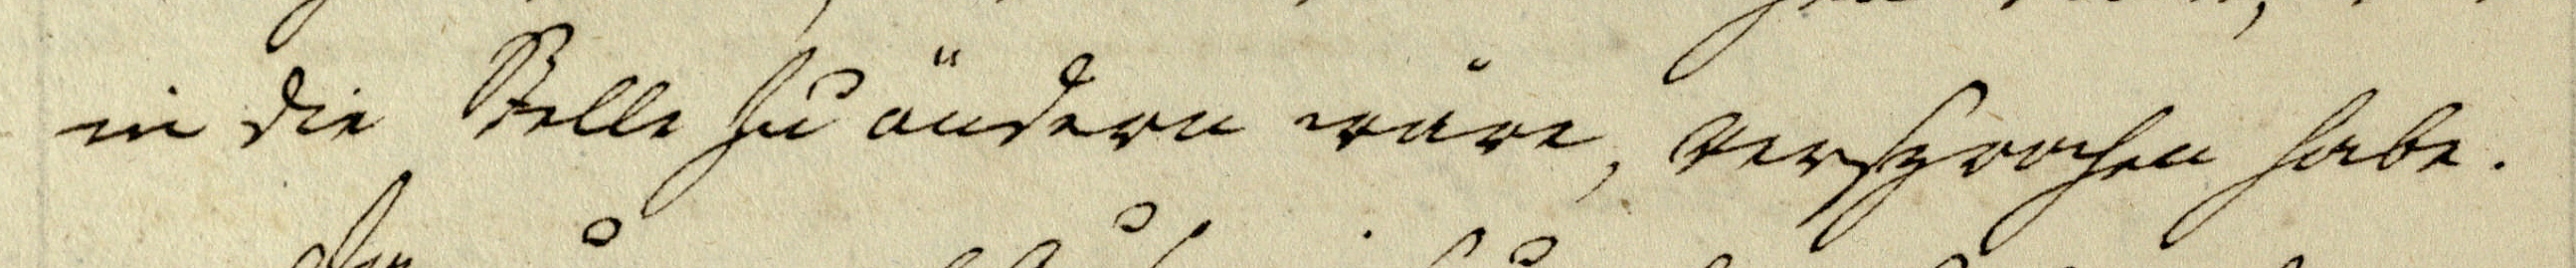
in die Stelle zu ändern wäre, versprochen habe.
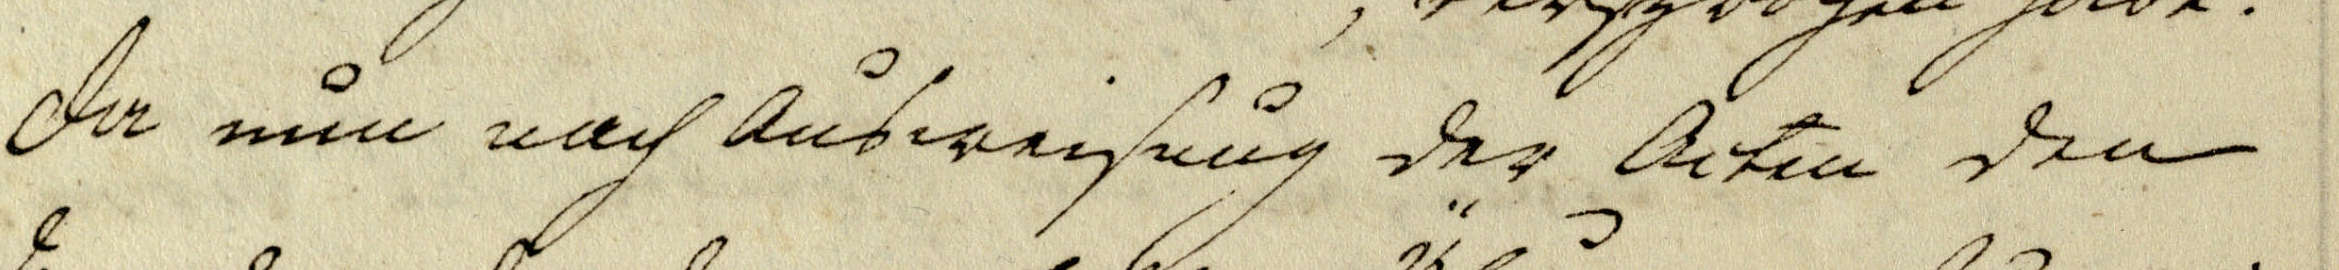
Da nun nach Ausweisung der Acten den
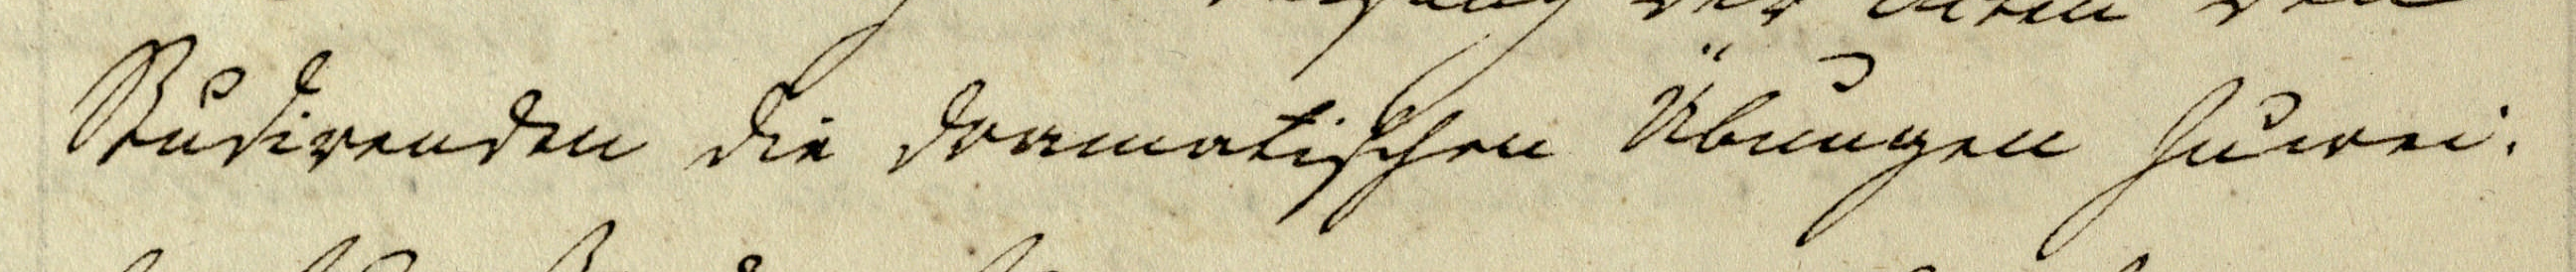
Studirenden die dramatischen Übungen zuwei¬
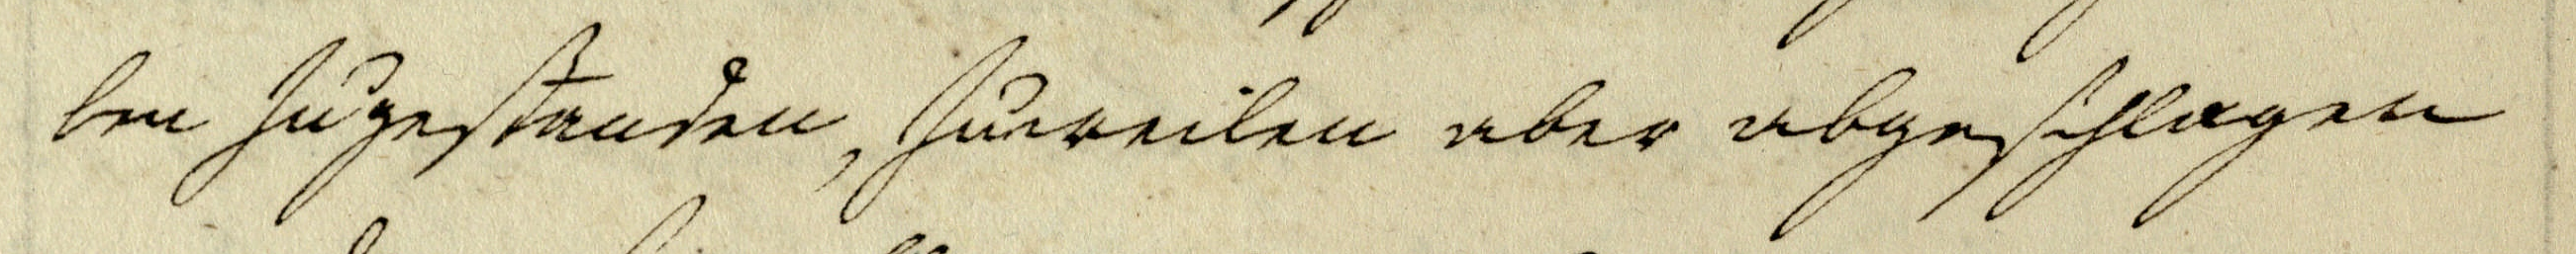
len zugestanden, zuweilen aber abgeschlagen
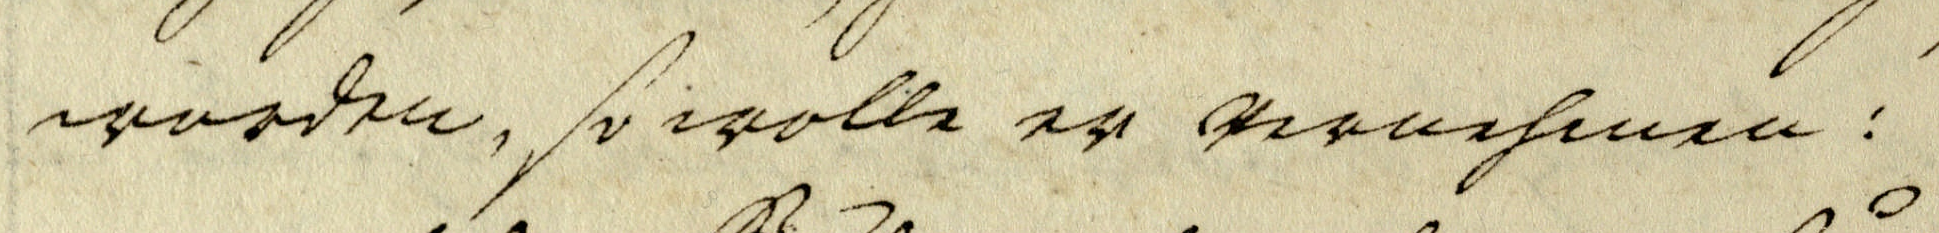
worden, so wolle er vernehmen:
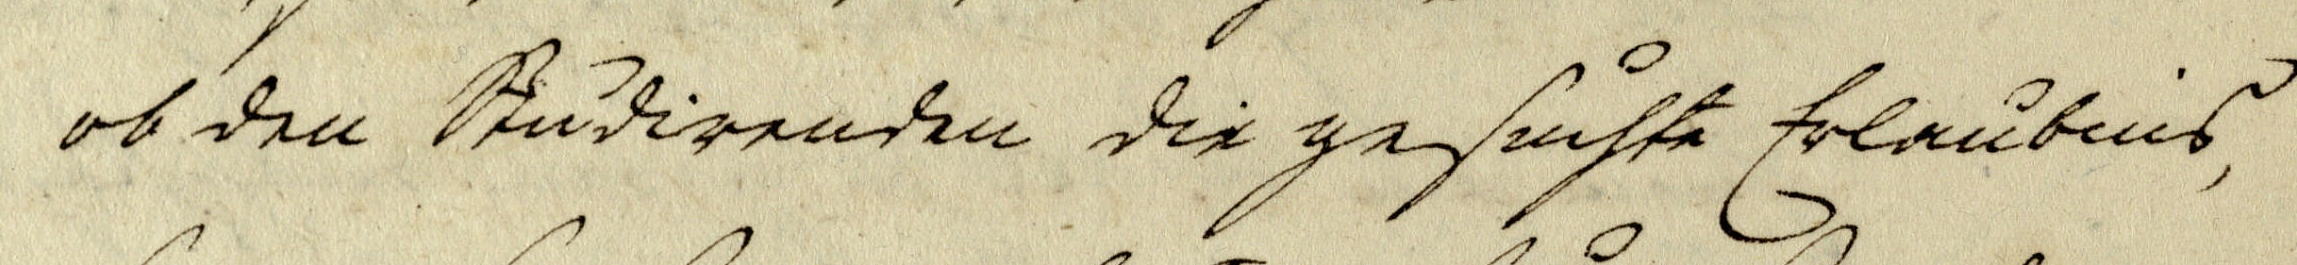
ob den Studirenden die gesuchte Erlaubnis,
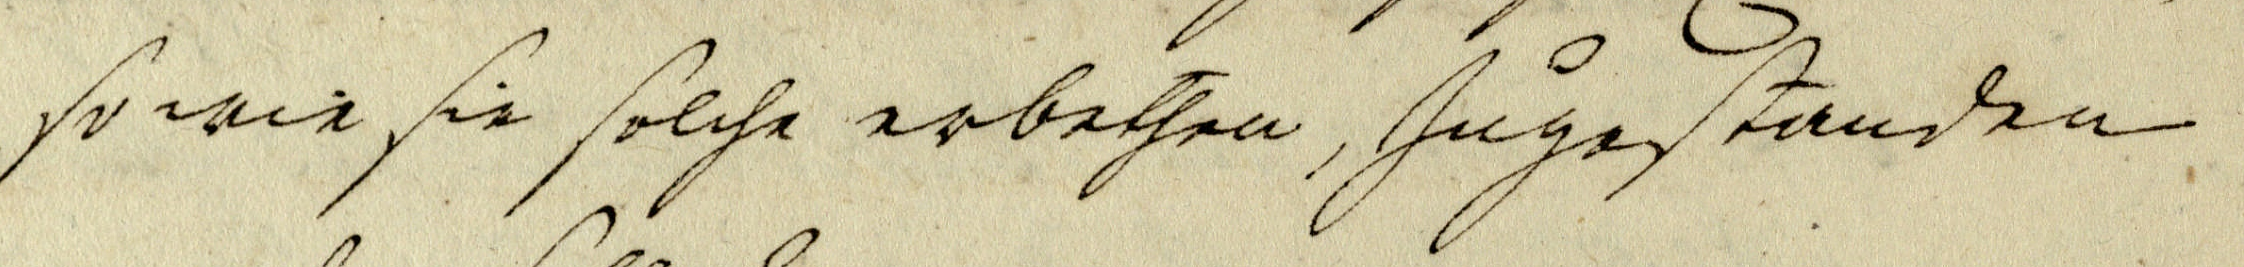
so wie sie solche erbethen, zugestanden
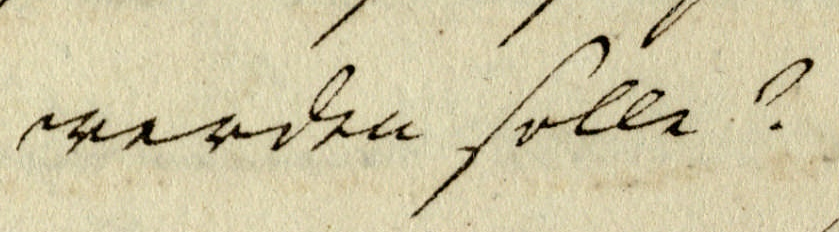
werden solle?
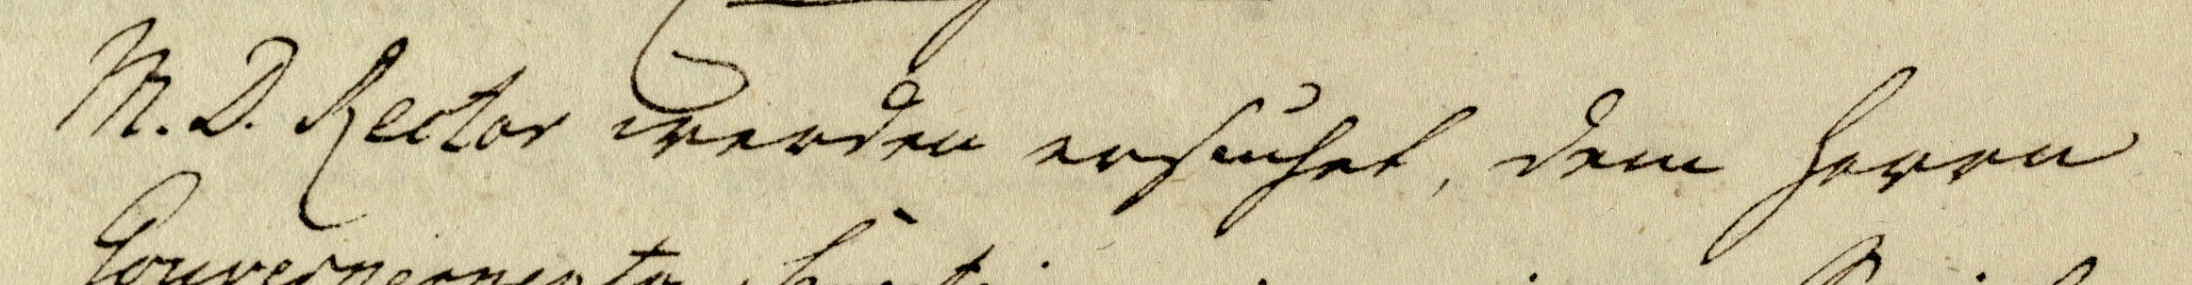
M. D. Rector werden ersuchet, dem Herrn
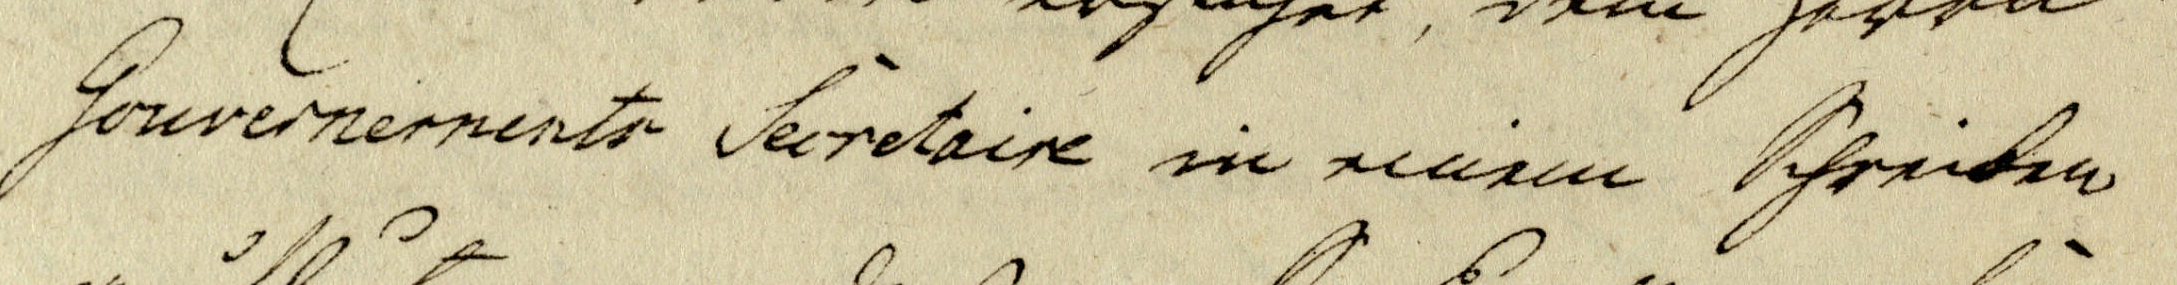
Gouvernements Secretaire in einem Schreiben
